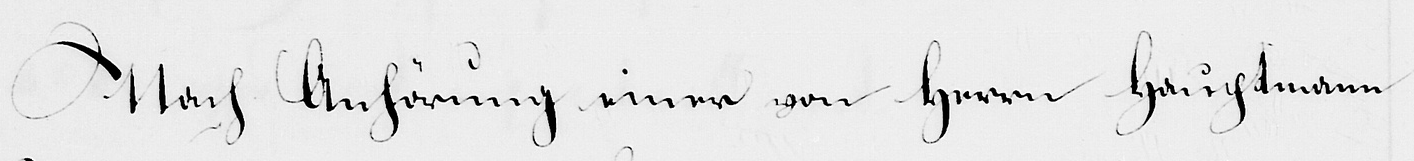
Nach Anhörung einer von Herrn Hauptmann
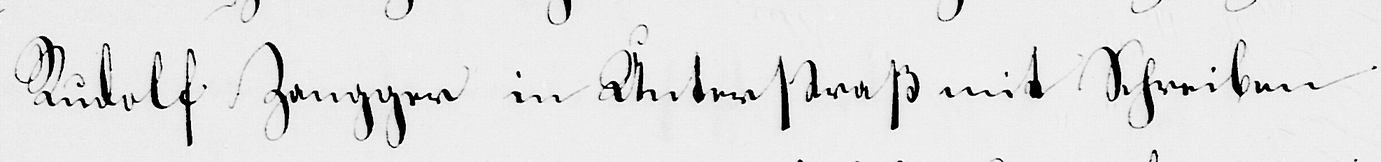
Rudolf Zangger in Unterstraß mit Schreiben
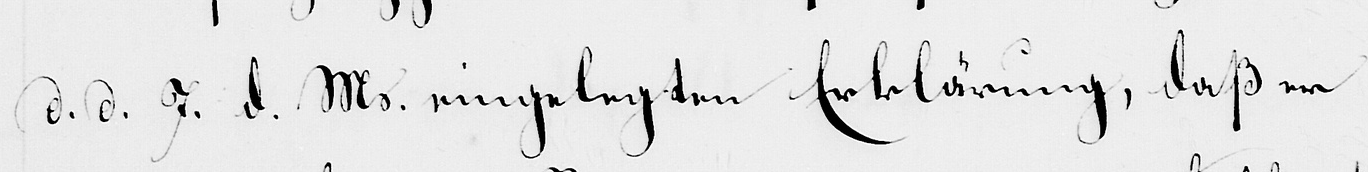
d. d. 7. d. Ms. eingelegten Erklärung, daß er
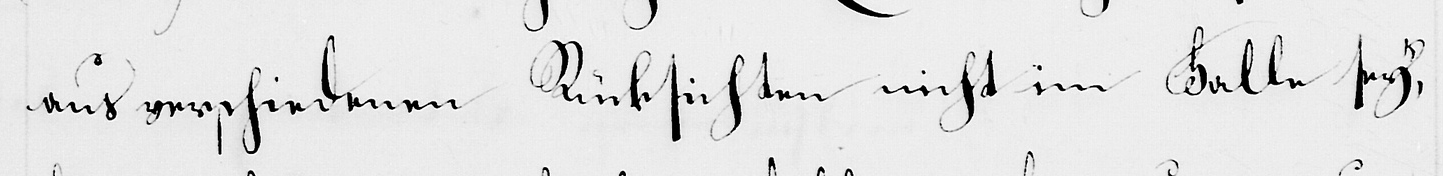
aus verschiedenen Rücksichten nicht im Falle sey,
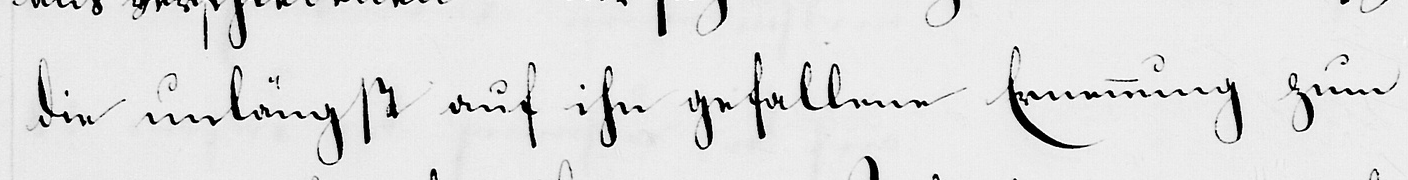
die unlängst auf ihn gefallene Ernennung zum
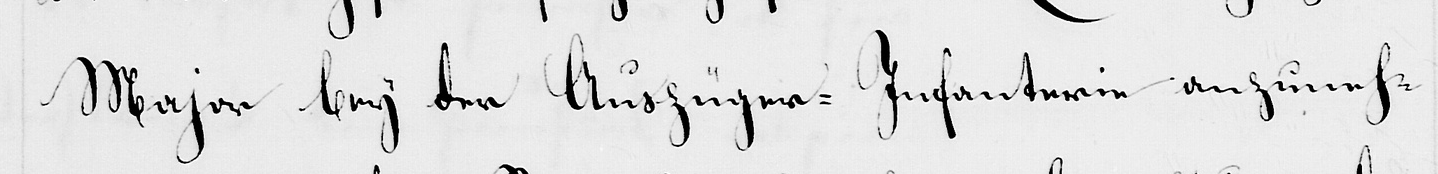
Major bey der Auszüger-Infanterie anzuneh¬
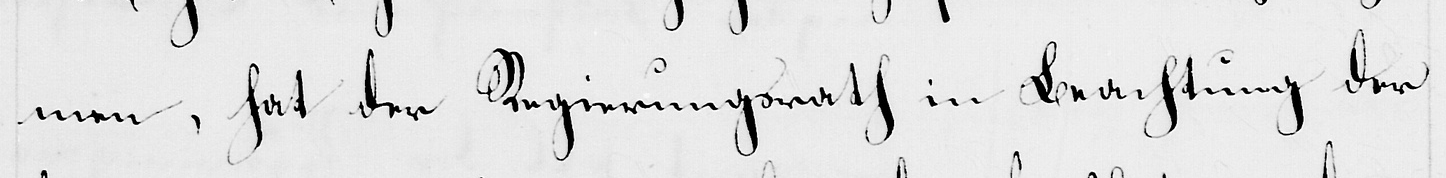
men, hat der Regierungsrath in Beachtung der
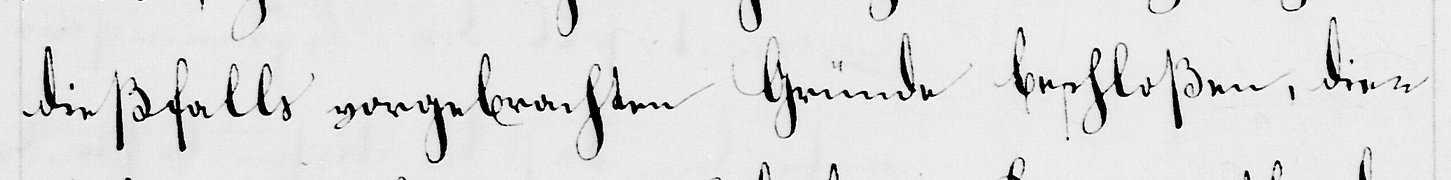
dießfalls vorgebrachten Gründe beschloßen, die¬
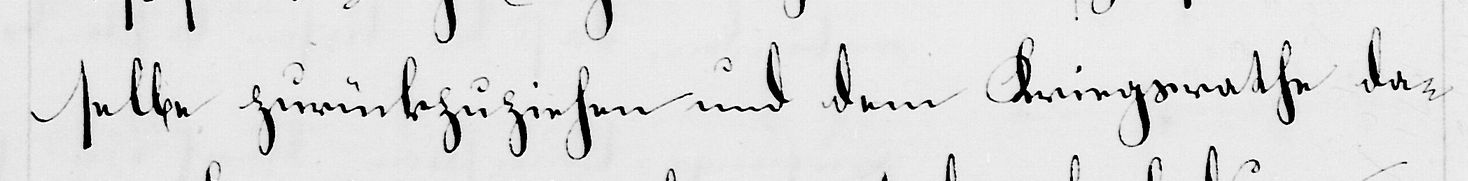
selbe zurückzuziehen und dem Kriegsrathe da¬
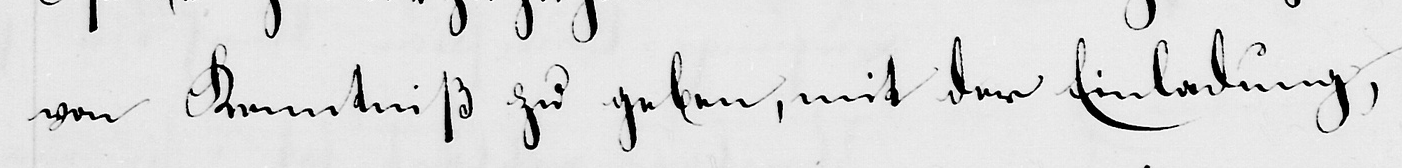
von Kenntniß zu geben, mit der Einladung,
